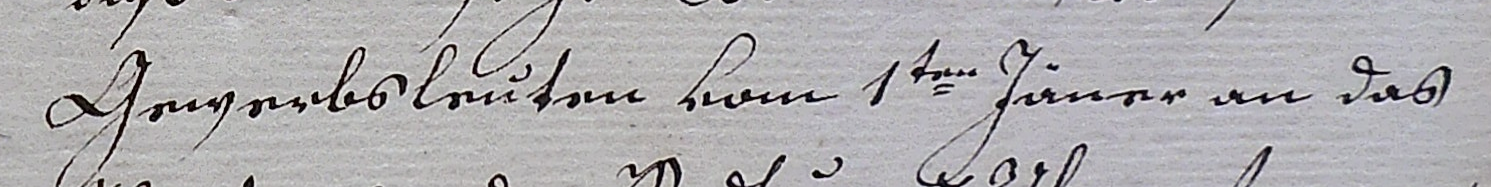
Gewerbsleuten vom 1te͇n Jäner an das
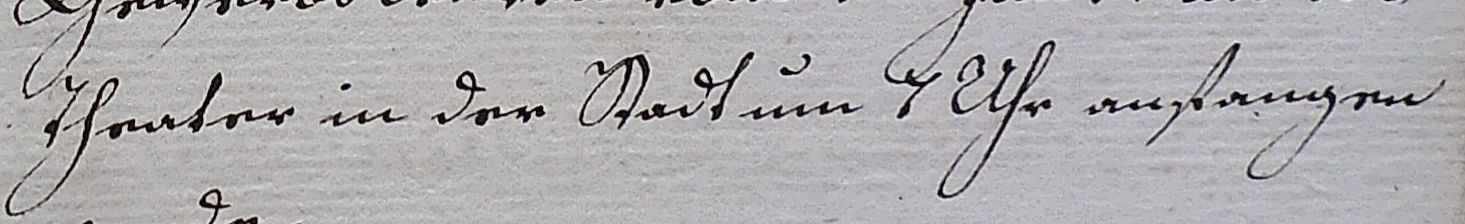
Theater in der Stadt um 7 Uhr anfangen
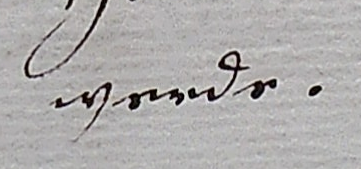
werde.
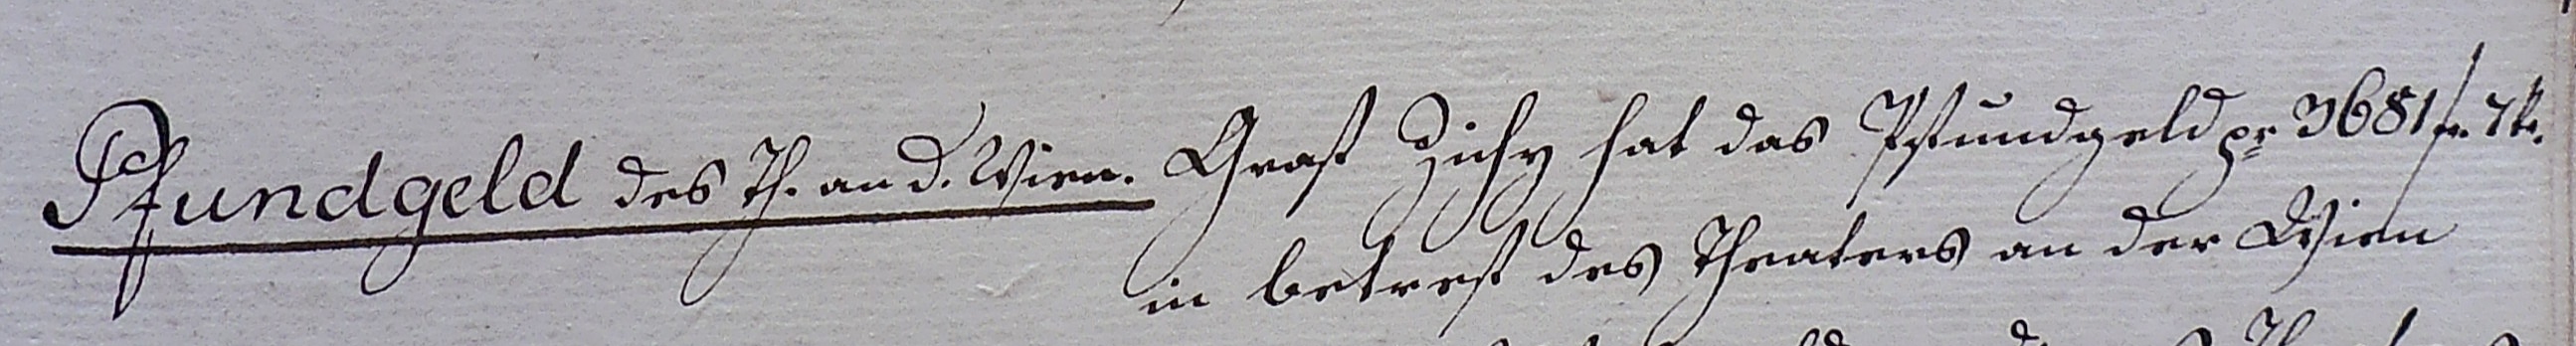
Pfundgeld des Th. an d. Wien. Graf Zichy hat das Pfundgeld 3681fr. 7kr.
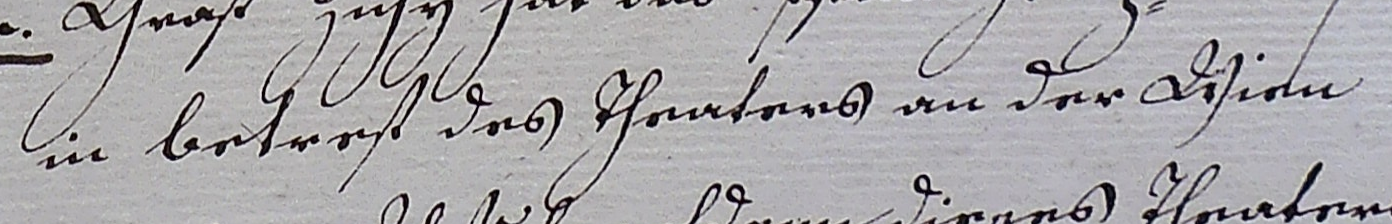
in betref des Theaters an der Wien
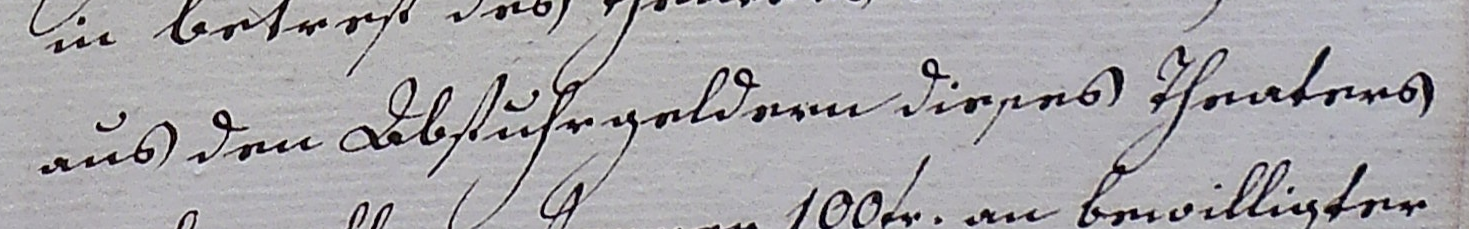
aus den Abfuhrgeldern dieses Theaters
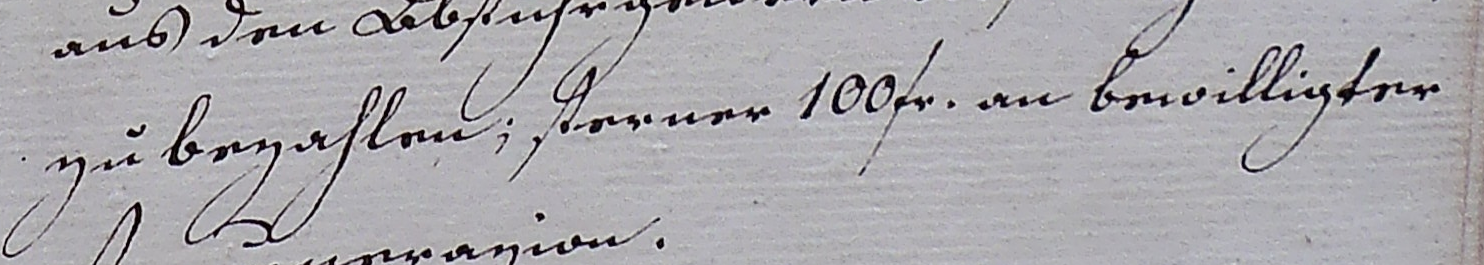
zu bezahlen; ferner 100fr. an bewilligter
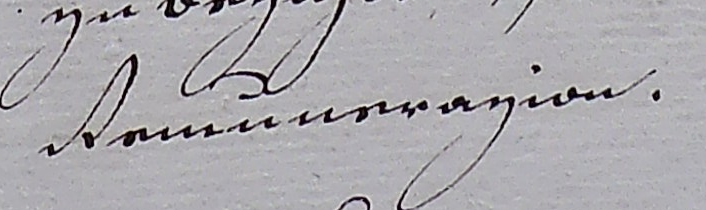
Remunerazion.
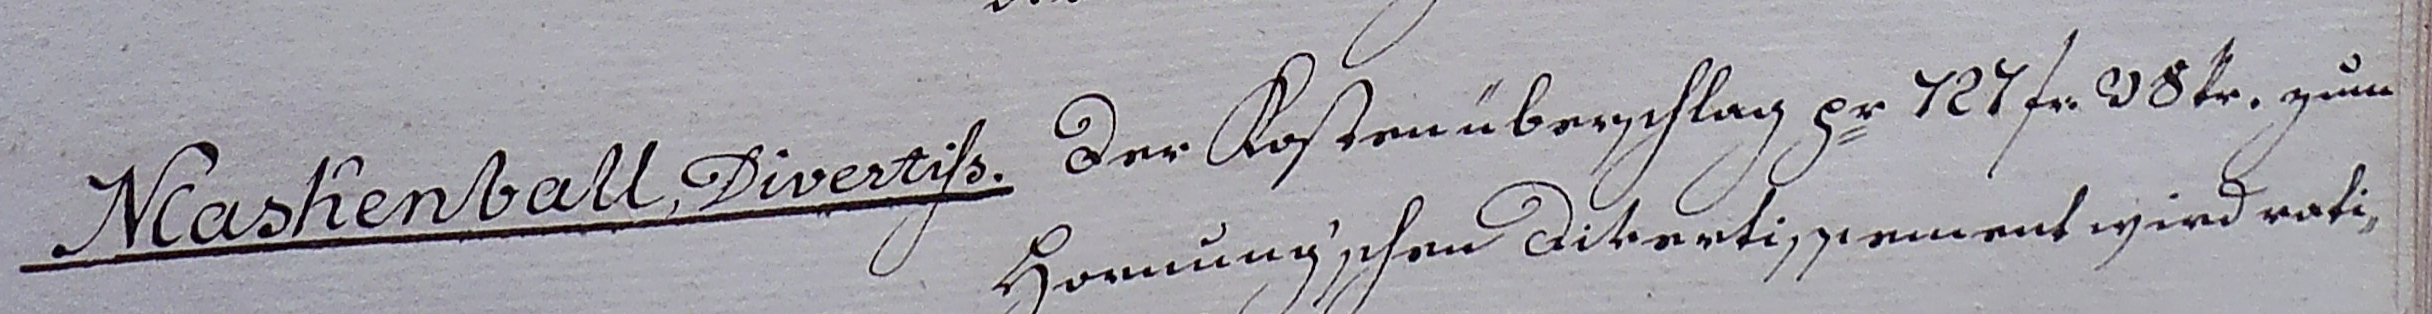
Maskenball, Divertiss. Der Kostenüberschlag pr͇ 727fr. 38kr. zum
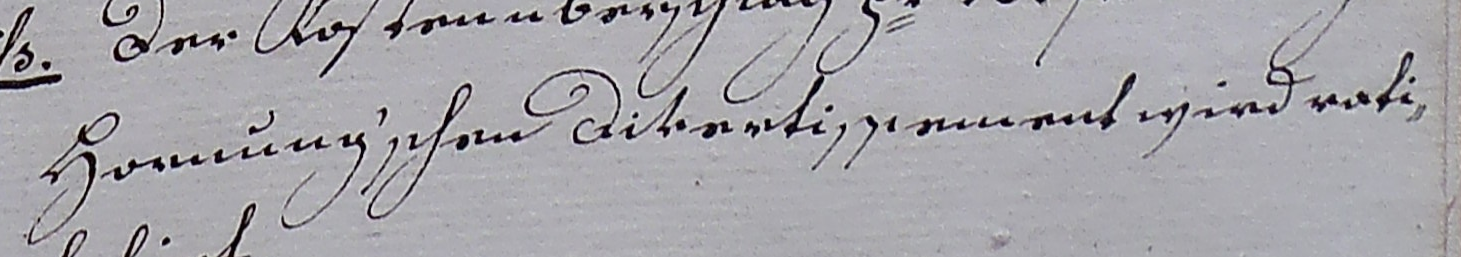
Hornung'schen Divertissement wird rati¬
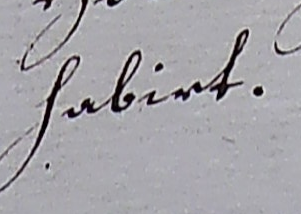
habirt.
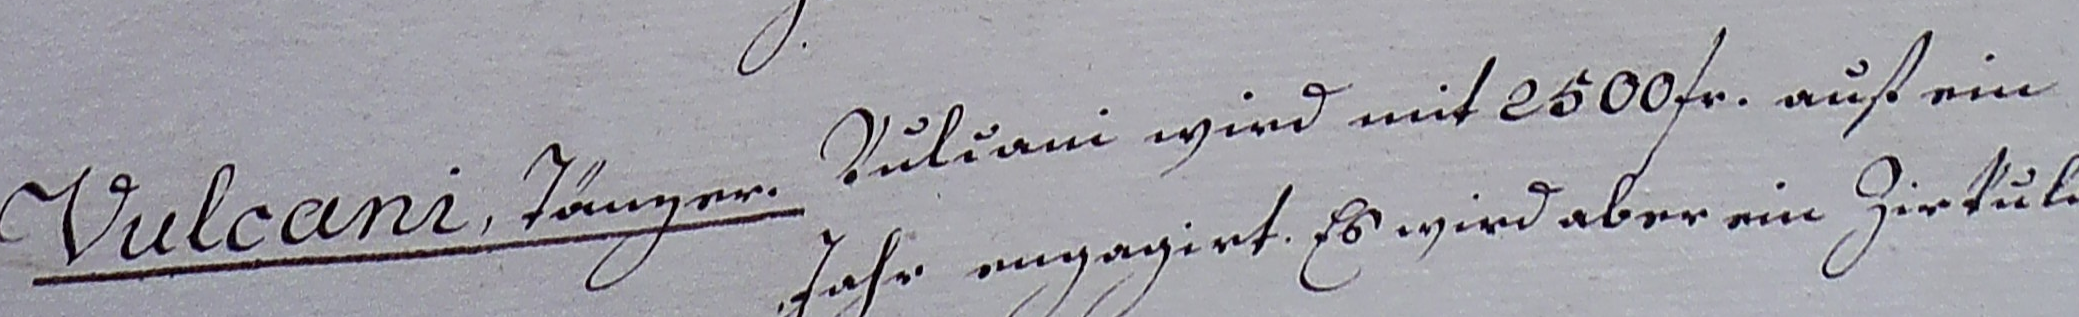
Vulcani, Tänzer. Vulcani wird mit 2500fr. auf ein
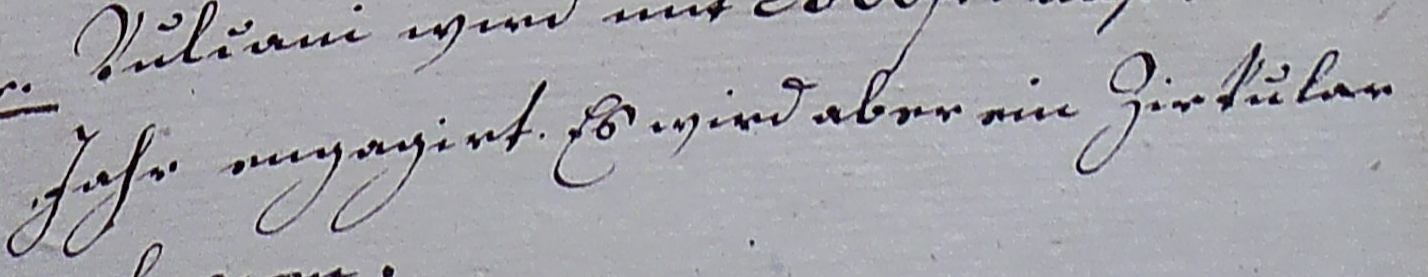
Jahr engagirt. Es wird aber ein Zirkular
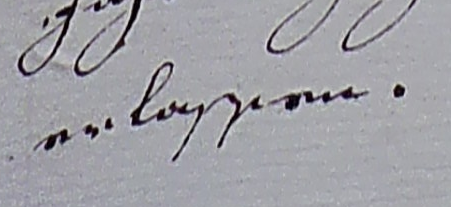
erlassen.
